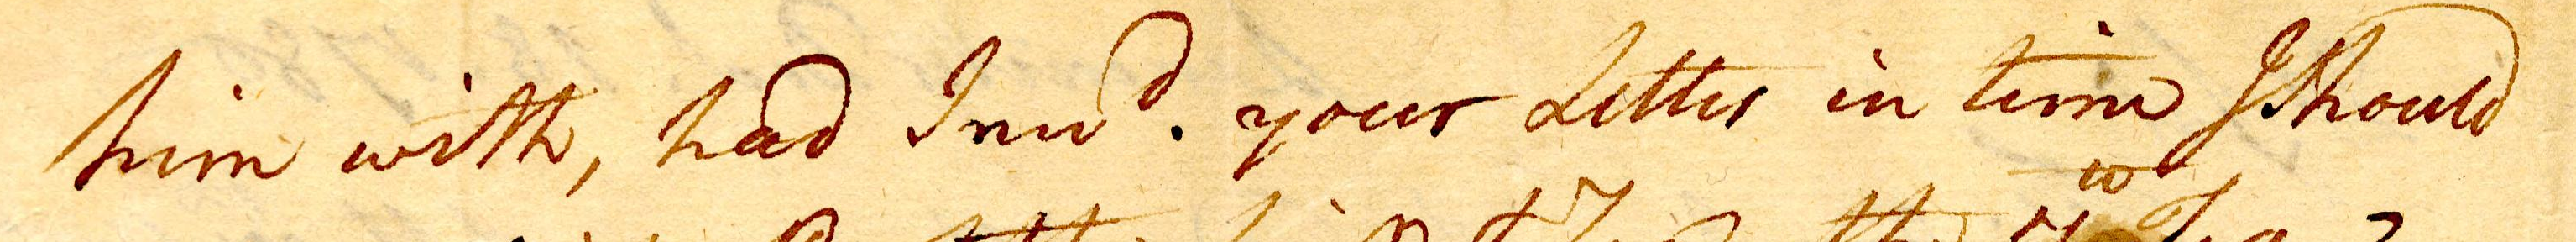him with, had I rec^d. your Letter in time I should
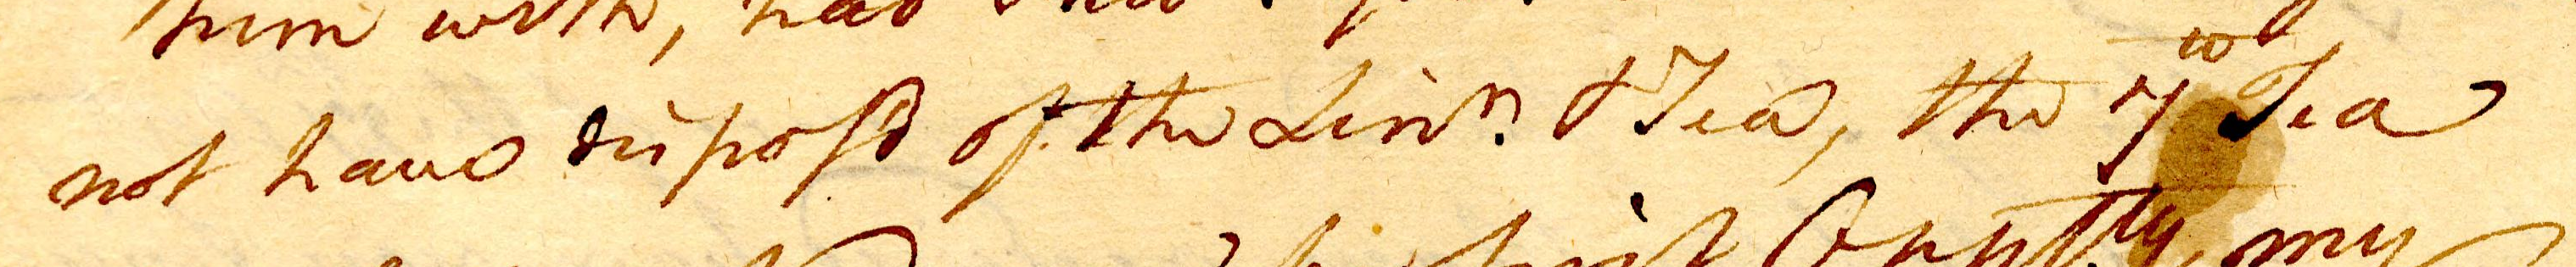not have disposd of the Lin^n. & Tea, the 7^to Tea
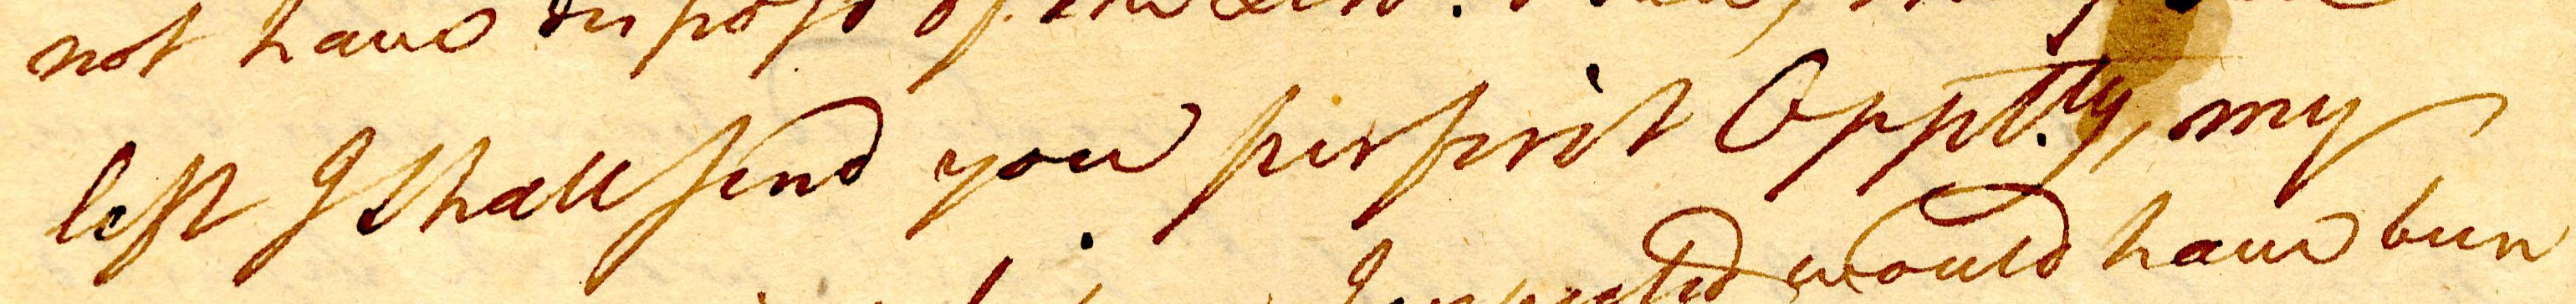left I shall send you per first Opp^ty my
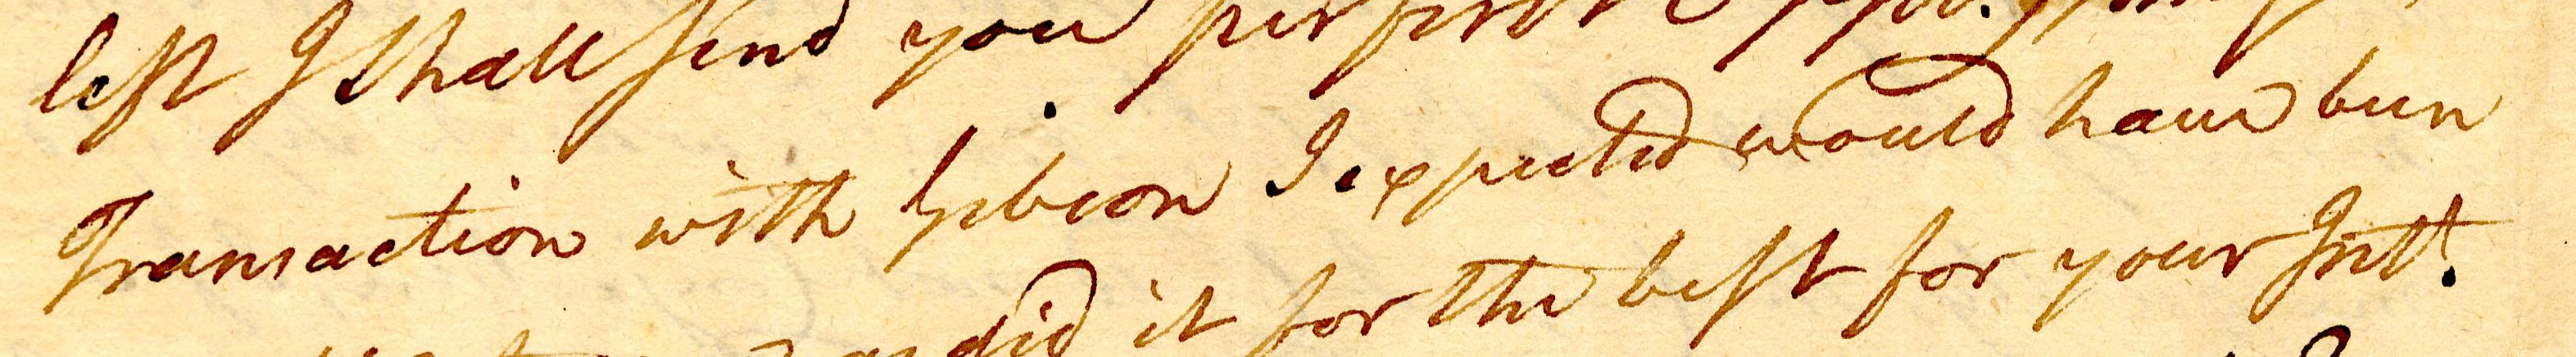Transaction with Gibson I expected would have been
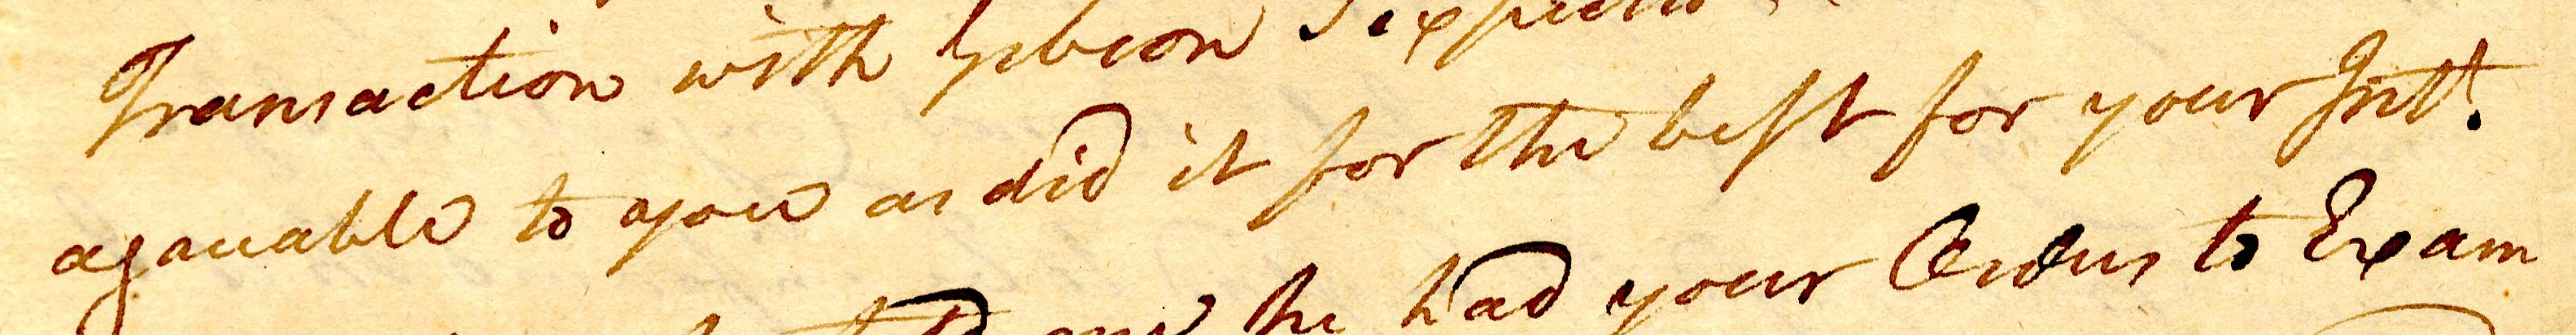arguable to you as did it for the best for your Int^t.
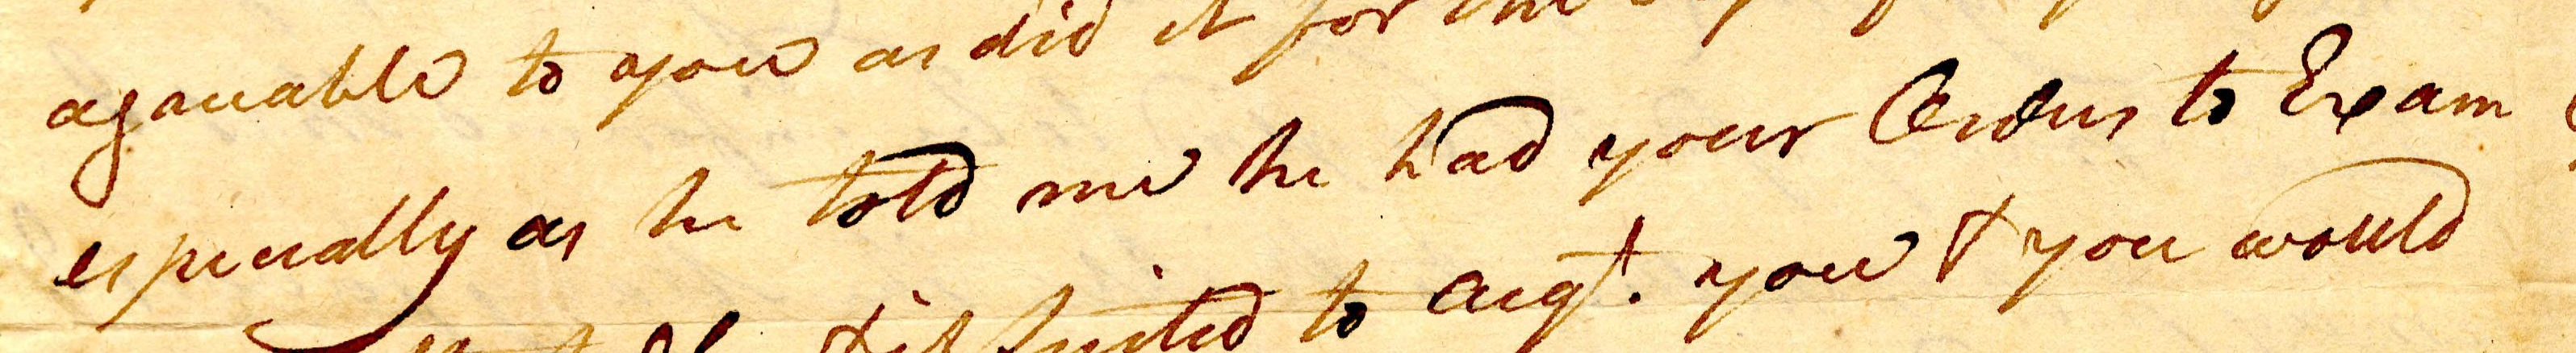espicially as he told me he had your Orders to Exam-
